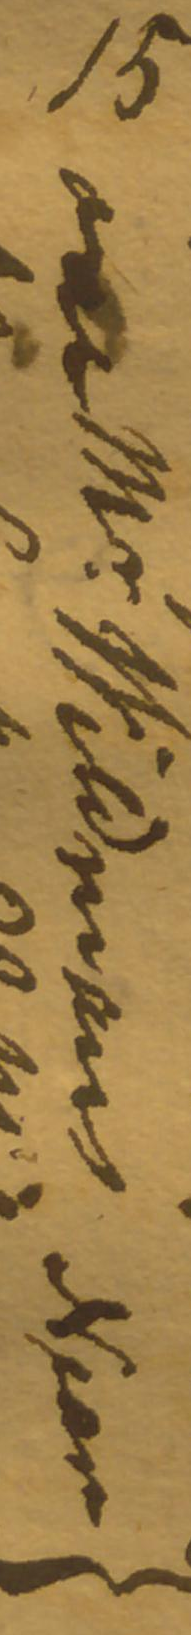one M^r. Wildmans Near
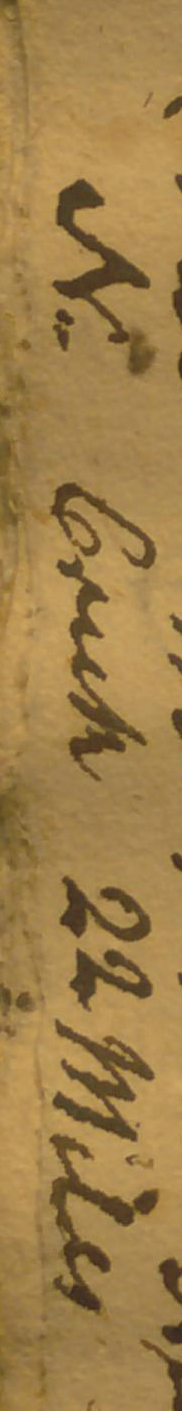N. Creek 22 Miles
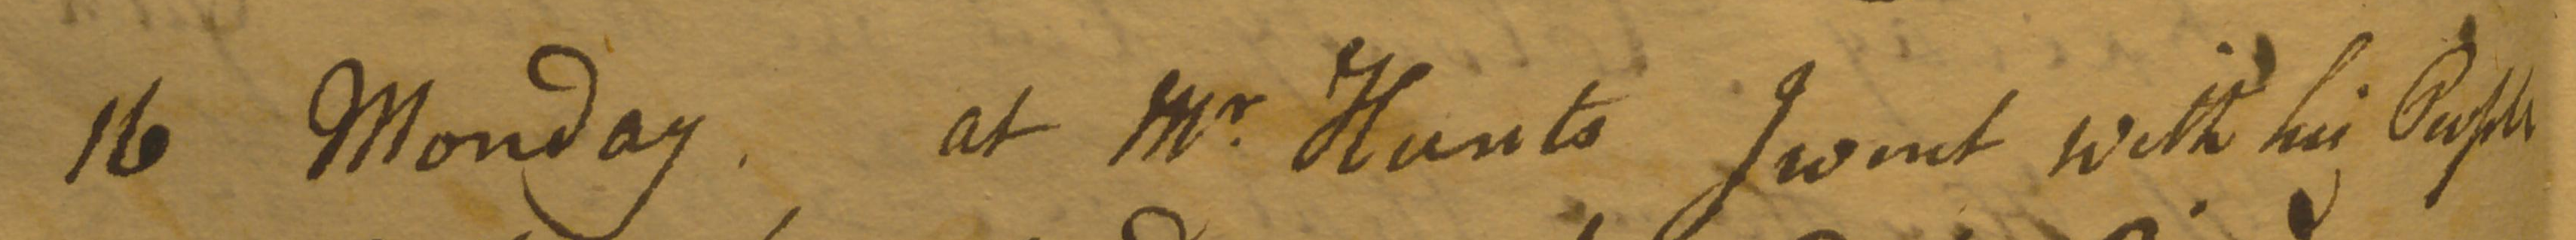16 Monday. at M^r. Hunts I went with his People
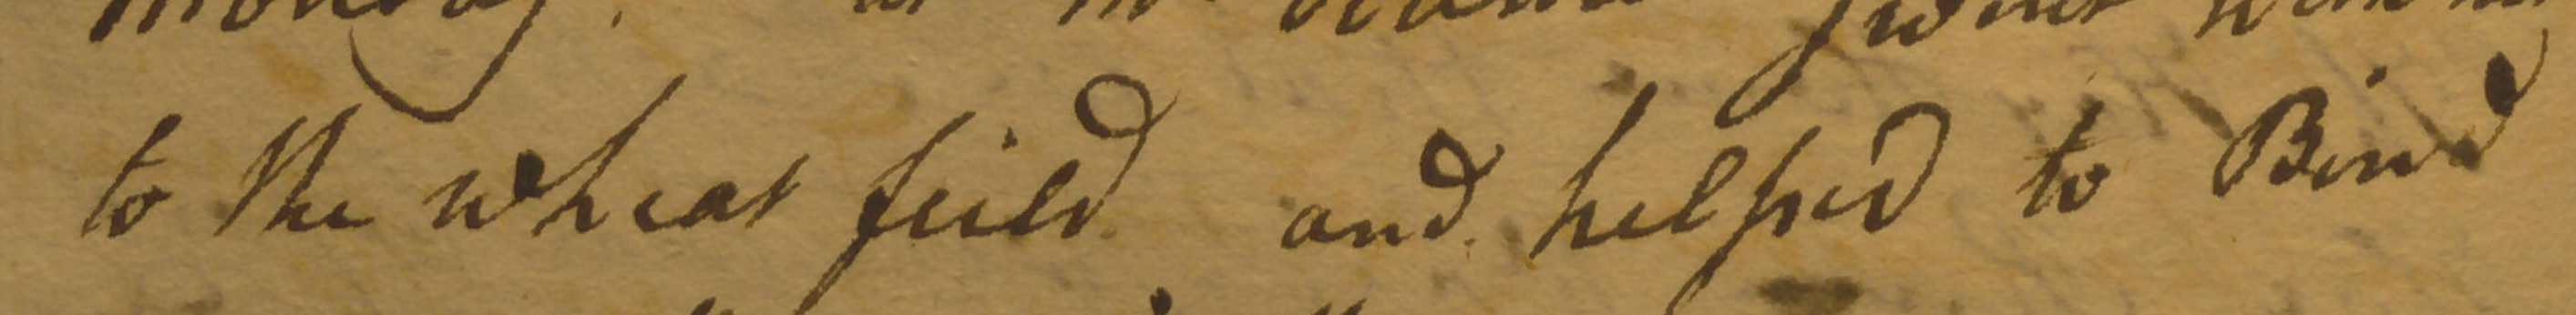to the wheat field and helped to Bind
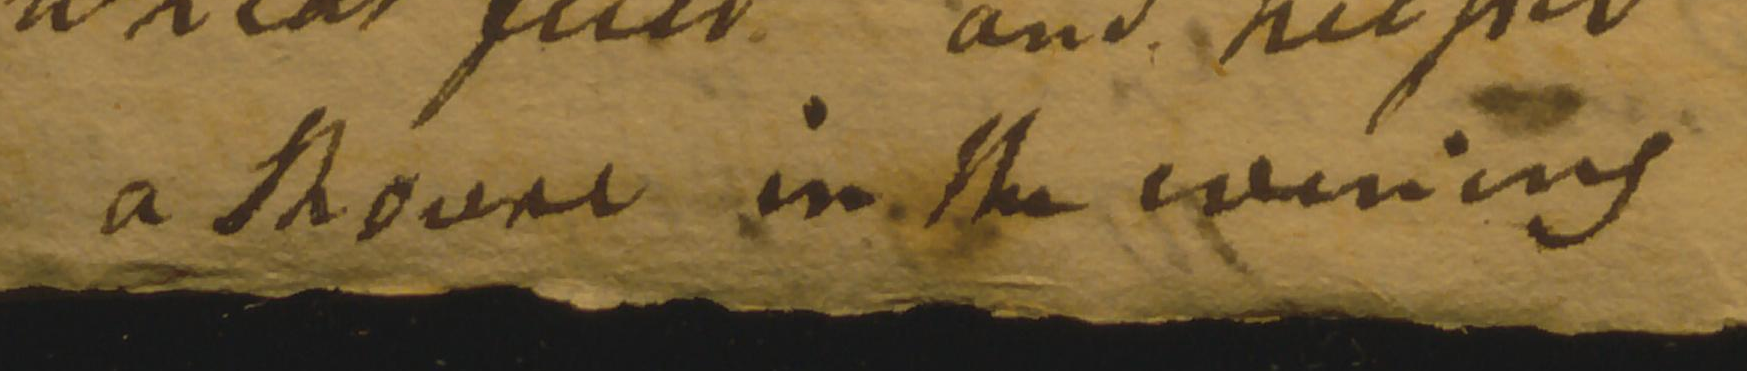a shoure in the evening
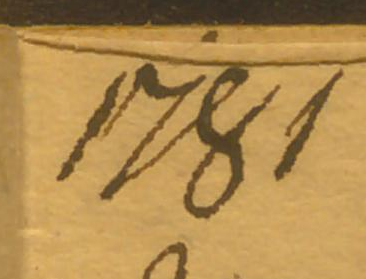1781
